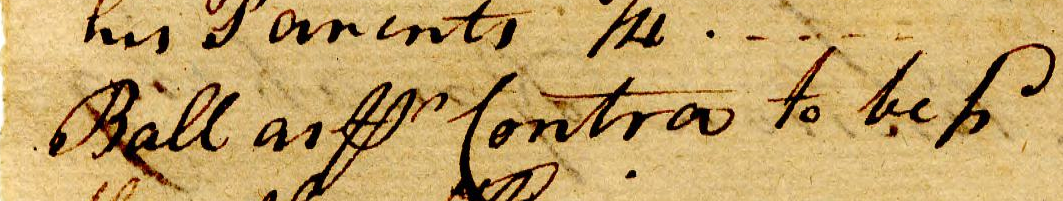Ball as per Contra to be p
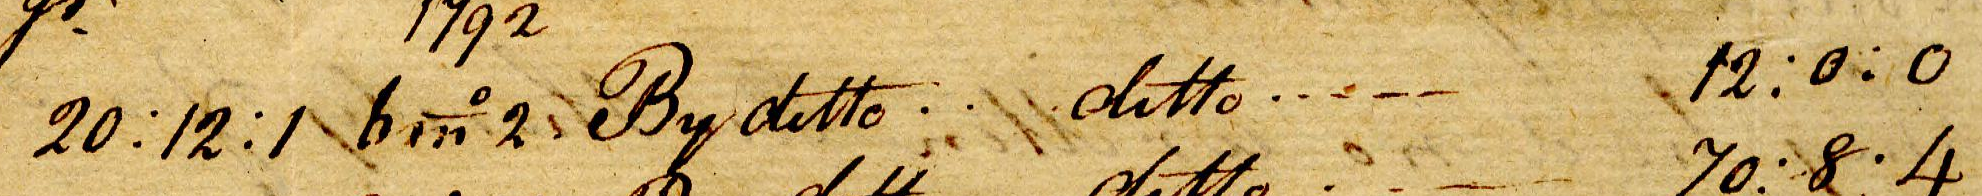20:12:1 6 m^o 2 By ditto.. dito...-- 12:0:0
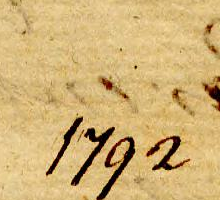1792
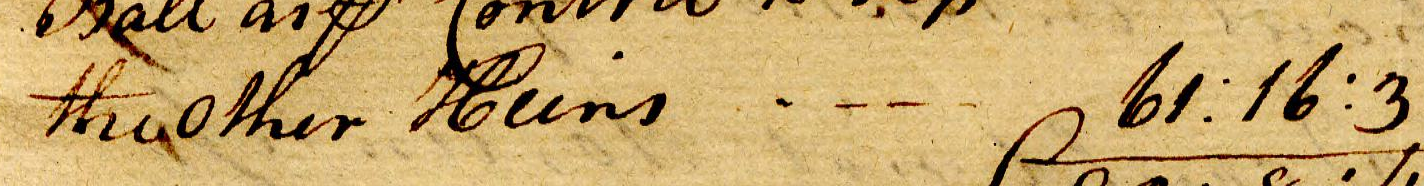the other Heirs. --- 61:16:3
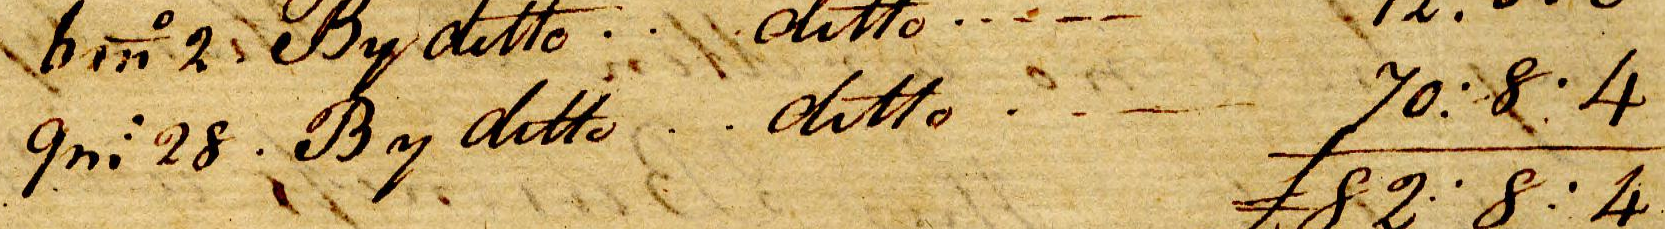9 m^o 28 By ditto.. dito. .- 70:8:4
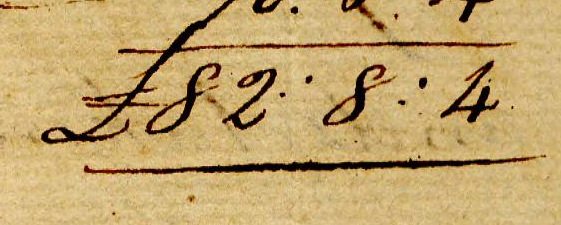£82:8:4
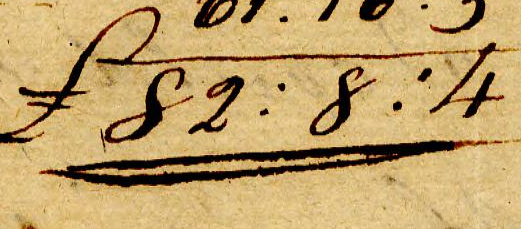£82:8:4
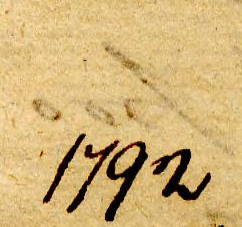1792
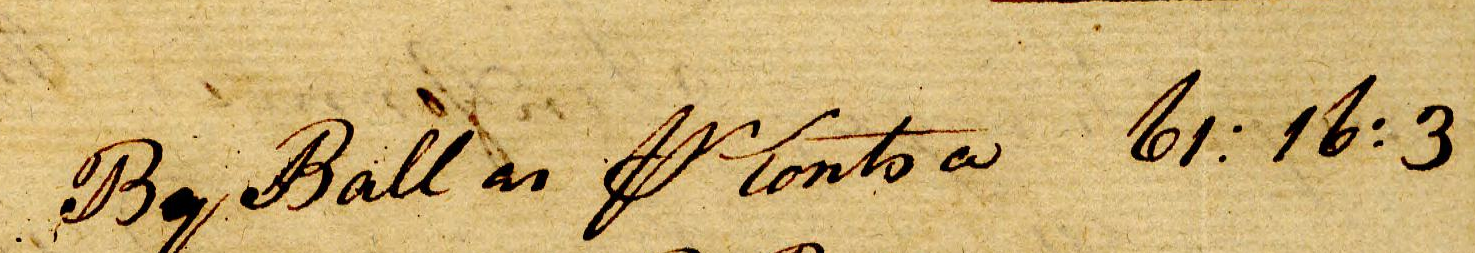By Ball as per Contra 61:16:3
